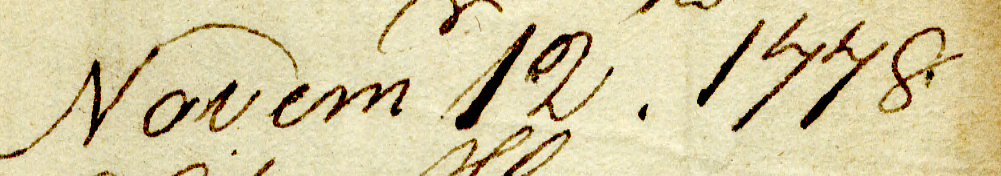Novem^r. 12^th. 1778
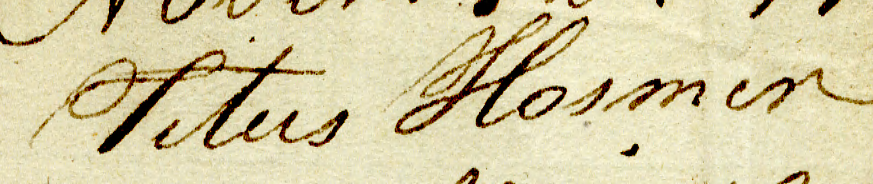Titus Hosmer
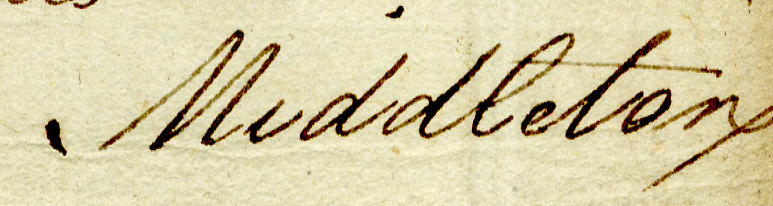Middleton
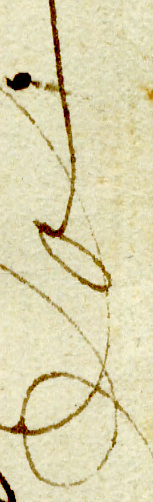To
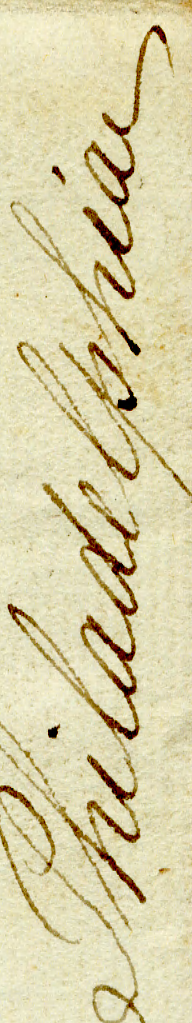Philadelphia
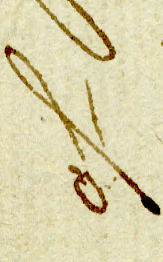of
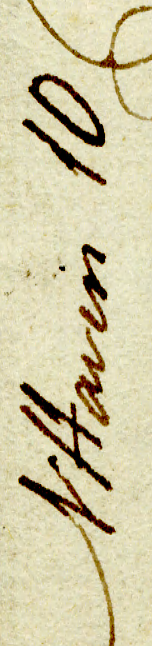N Haven 10
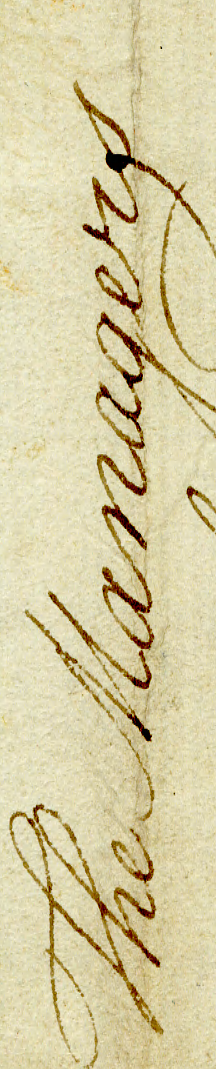The Managers
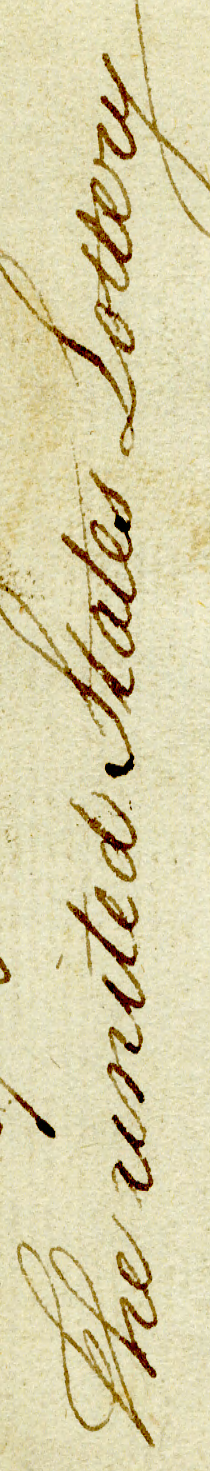the united States Lottery
